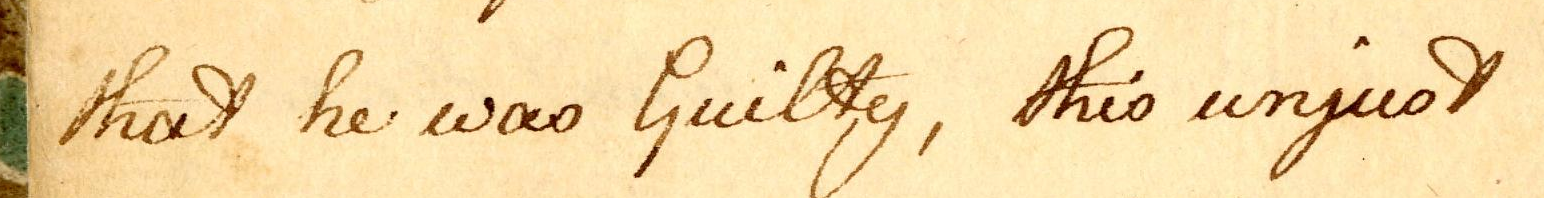that he was Guilty, this unjust
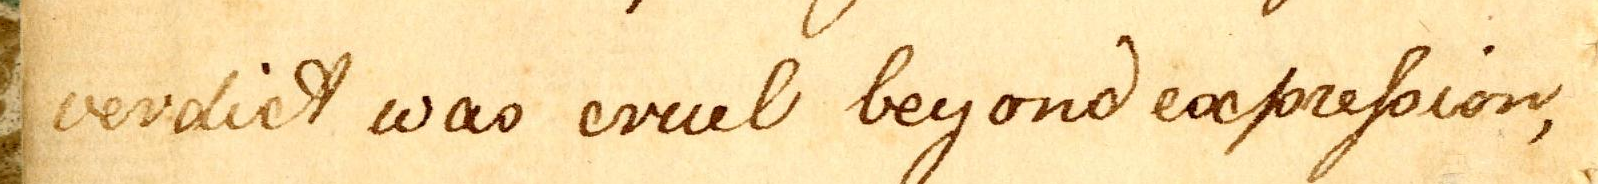verdict was cruel beyond expression,
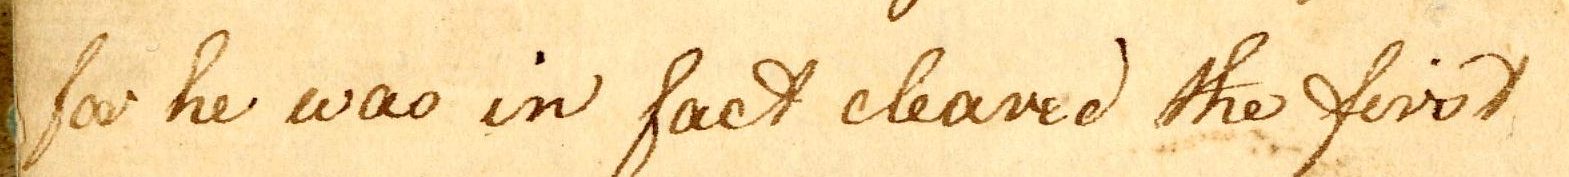for he was in fact cleard the first
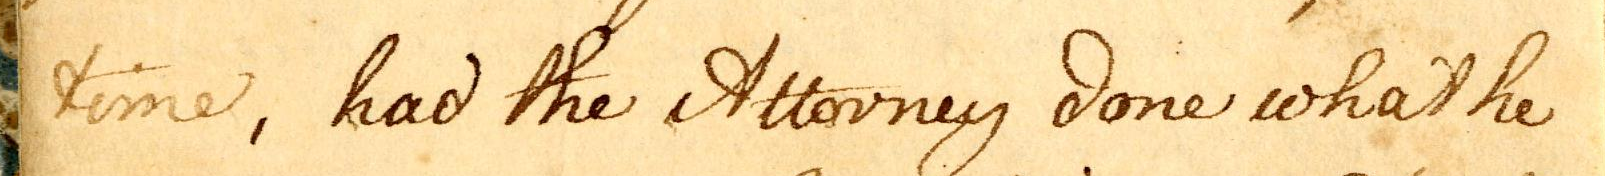time, had the Attorney done what he
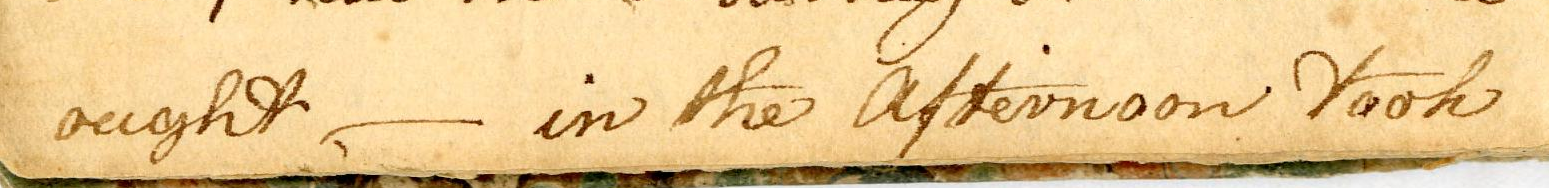ought- in the Afternoon took
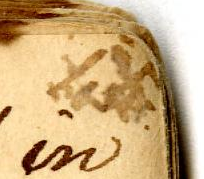45
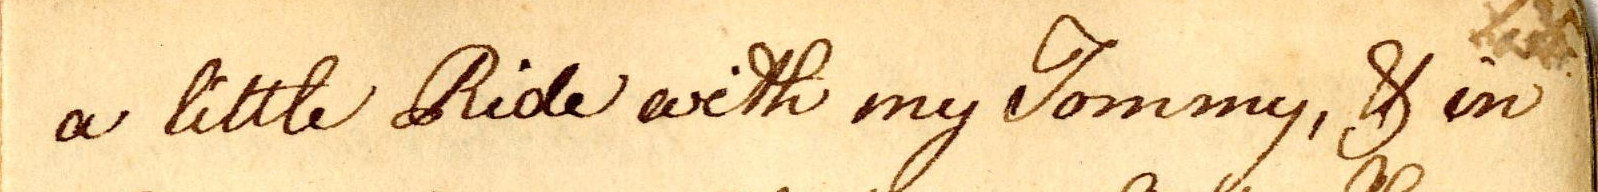a little Ride with my Tommy, & in
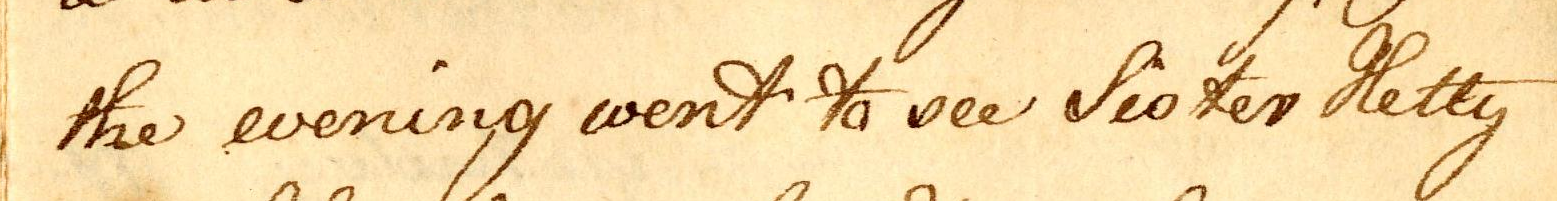the evening went to see Sister Hetty
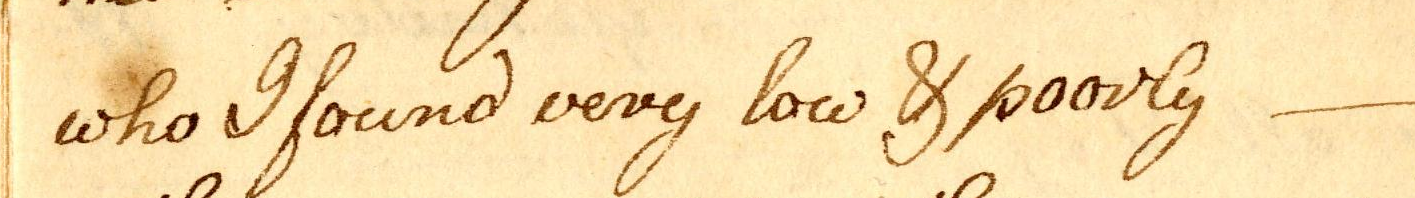who I found very low & poorly-
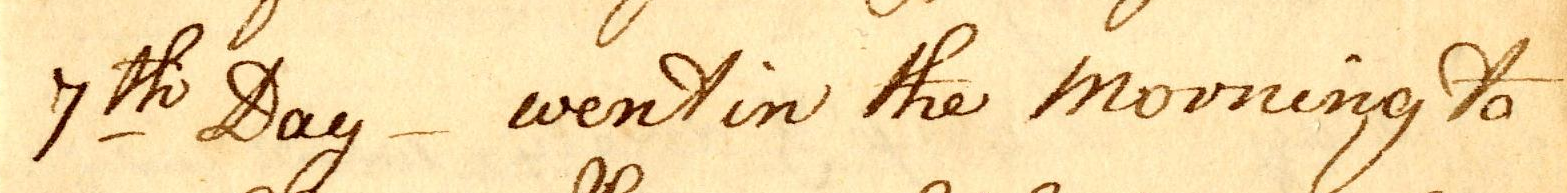7^th Day- went in the morning to
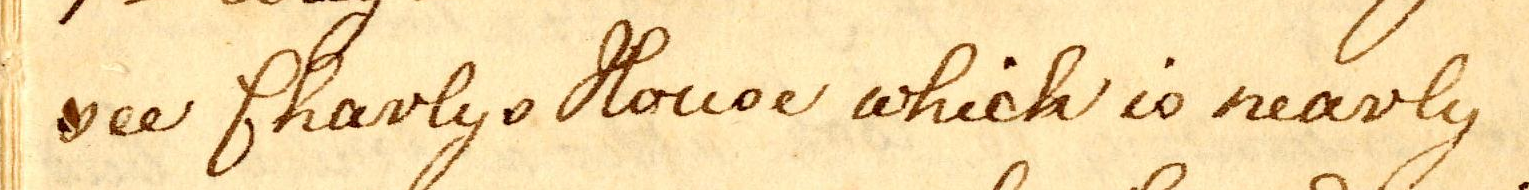see Charlys House which is nearly
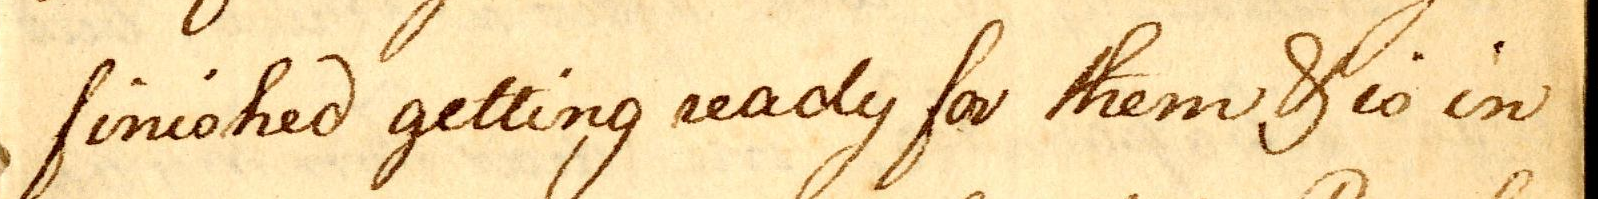finished getting ready for them & is in
